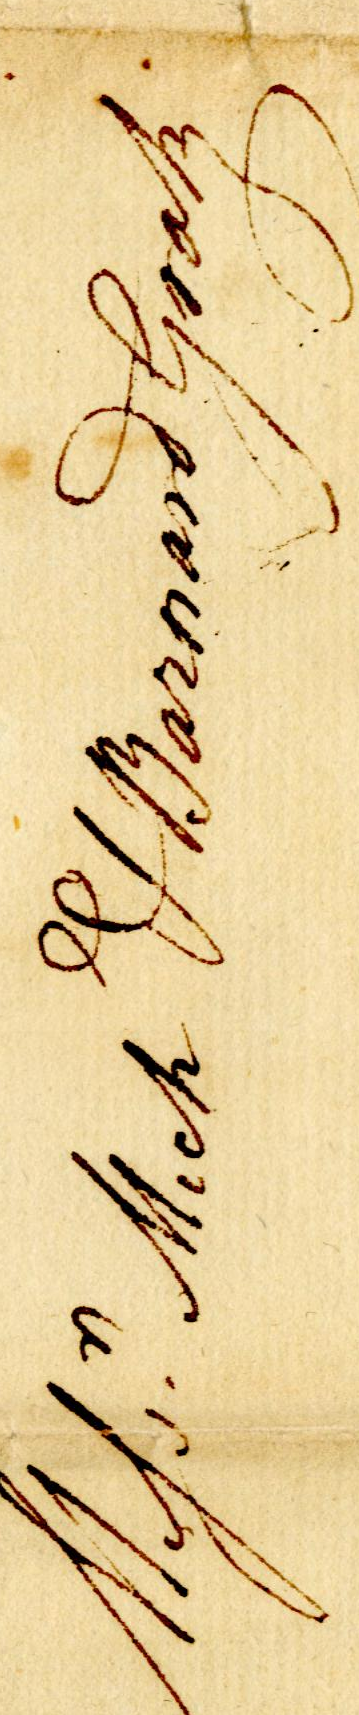Mess^rs Mich^l & Barnard Gratz
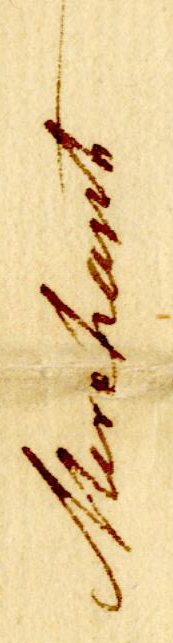Merchant
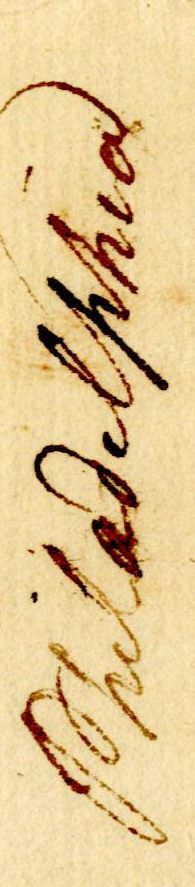Philadelphia
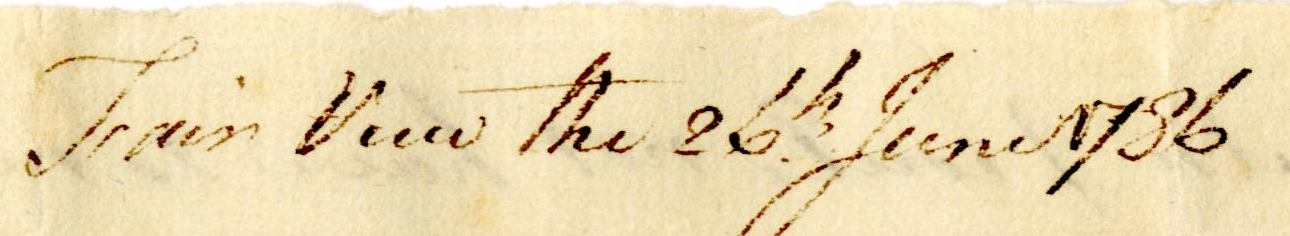Fair View the 26^th June 1786
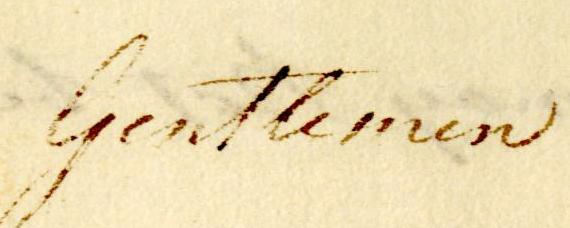Gentlemen
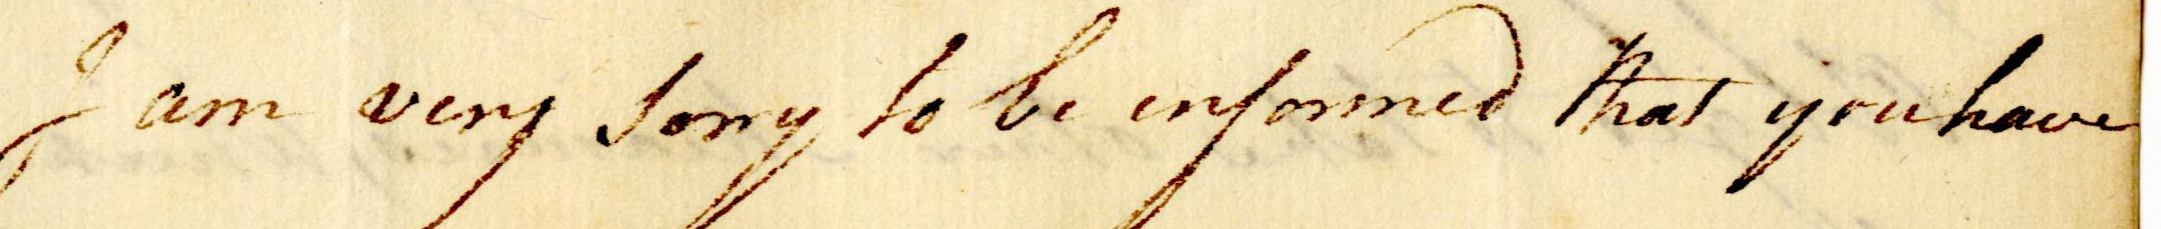I am very Sorry to be informed that you have
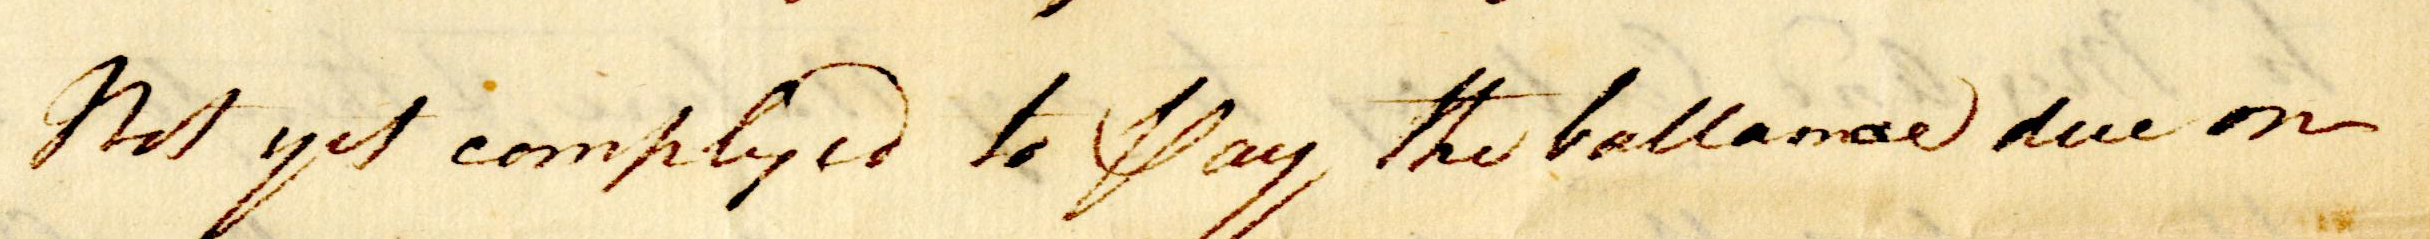not yet complyed to pay the Ballance due on
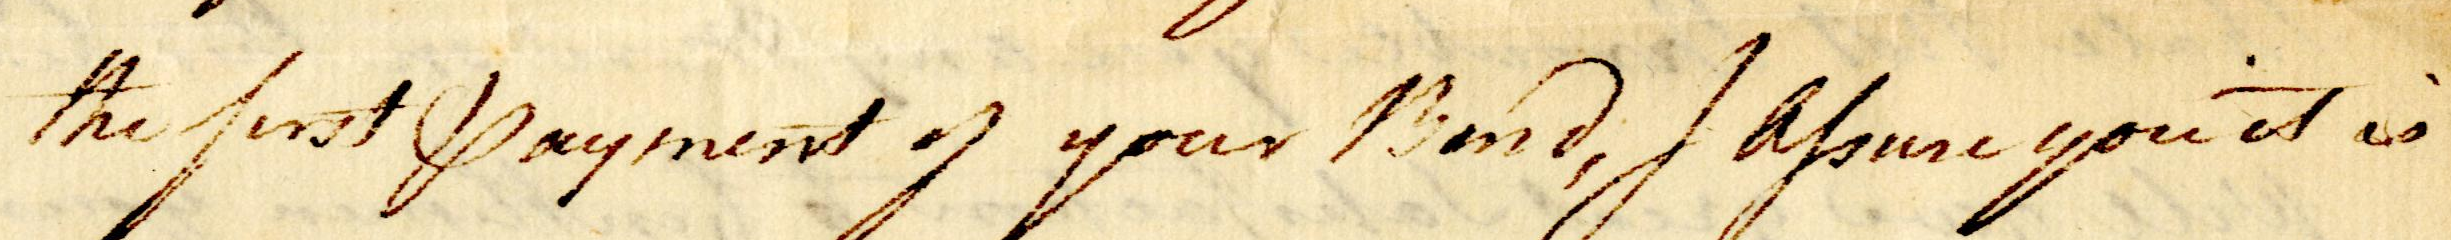the first Payment of your Bond, I Assure you it is
